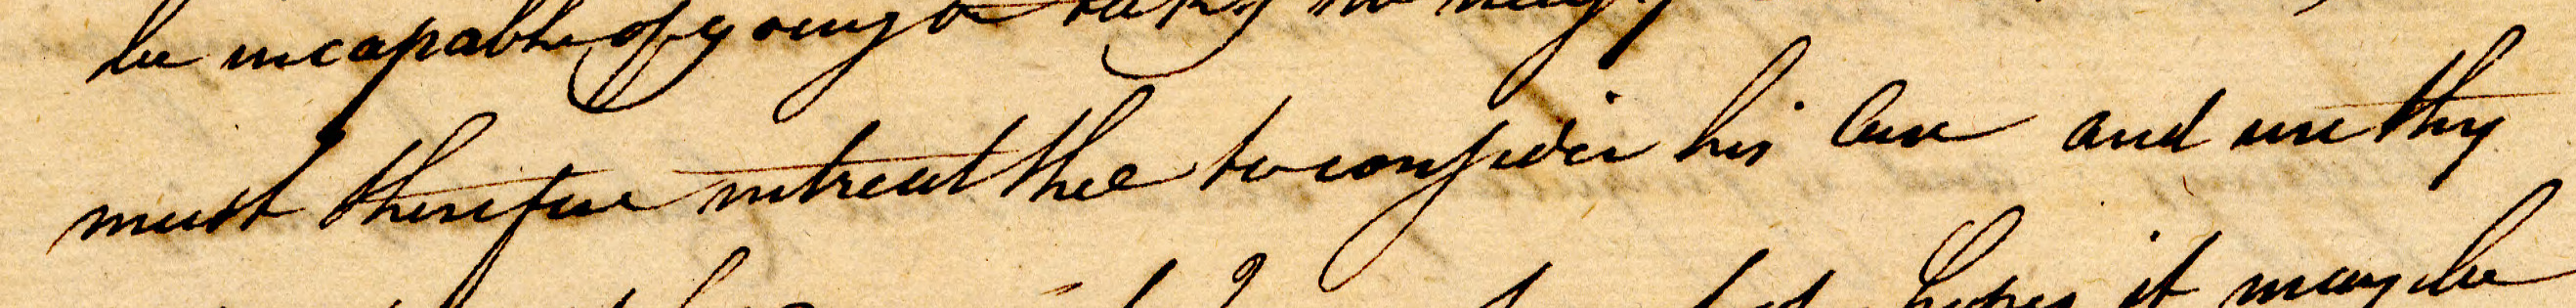must therefore intreat thee to consider his Case and use thy
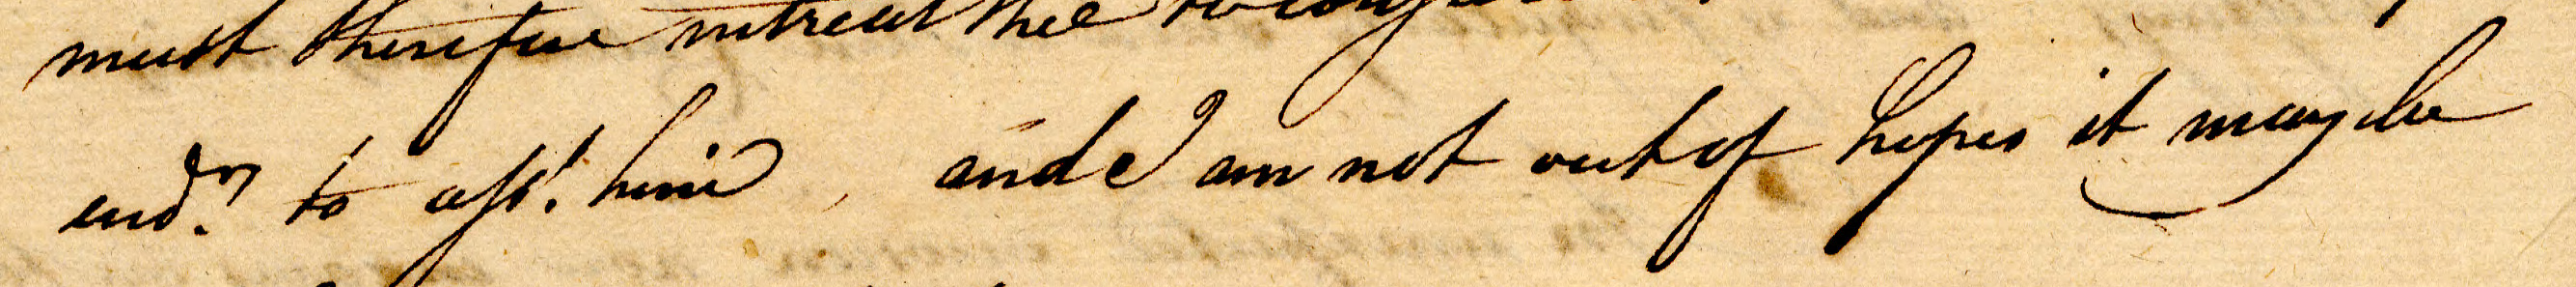end^r. to ass^t. him, and I am not out of hopes it may be
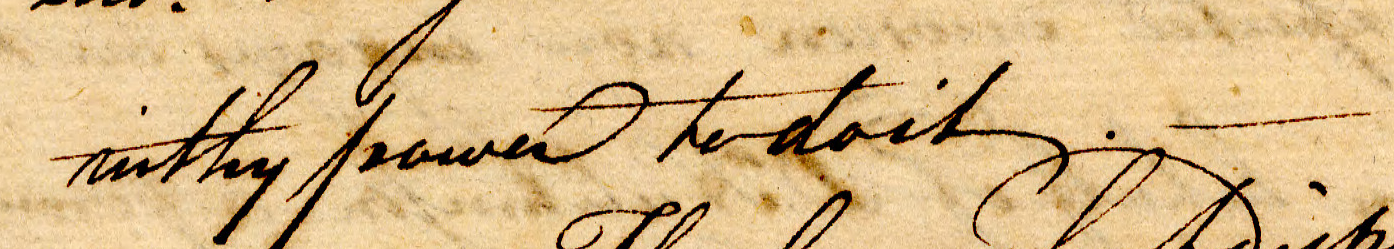in thy power to do it.-
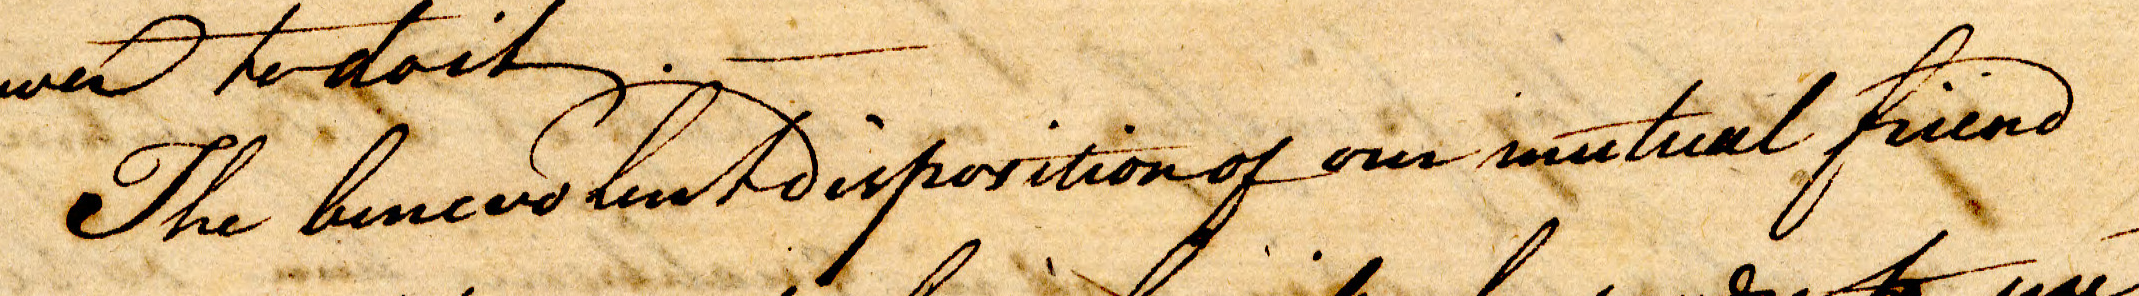The benevolent disposition of our mutual friend
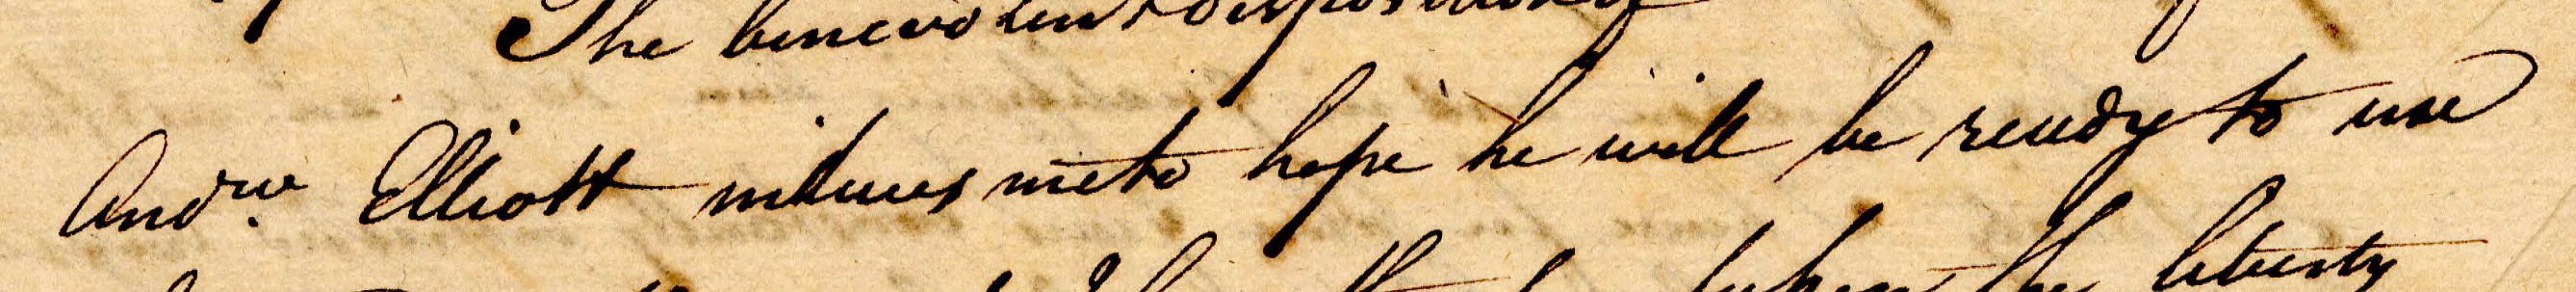And^w. Elliott induces me to hope he will be ready to use
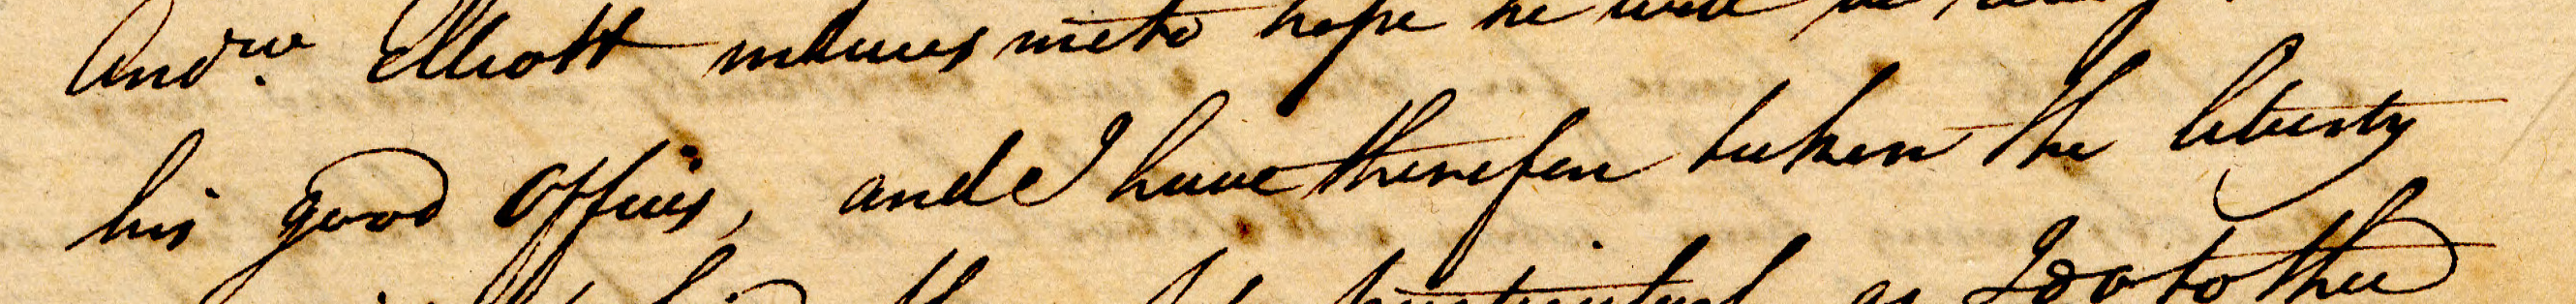his good Offices, and I have therefore taken the liberty
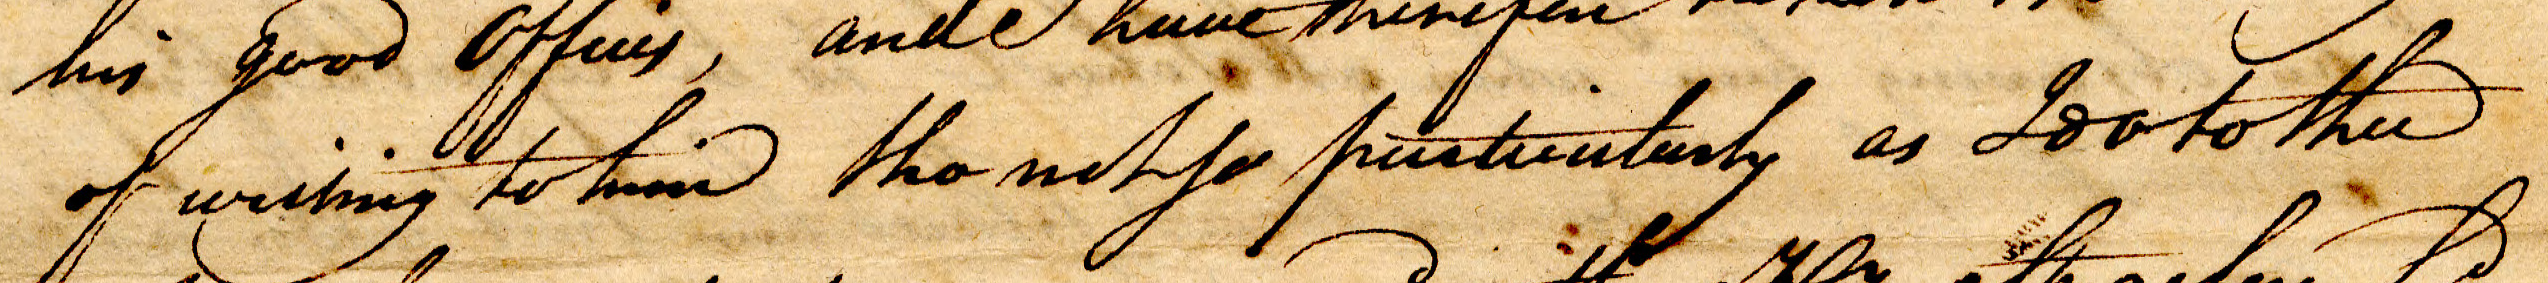of writing to him tho not so particularly as I do to thee
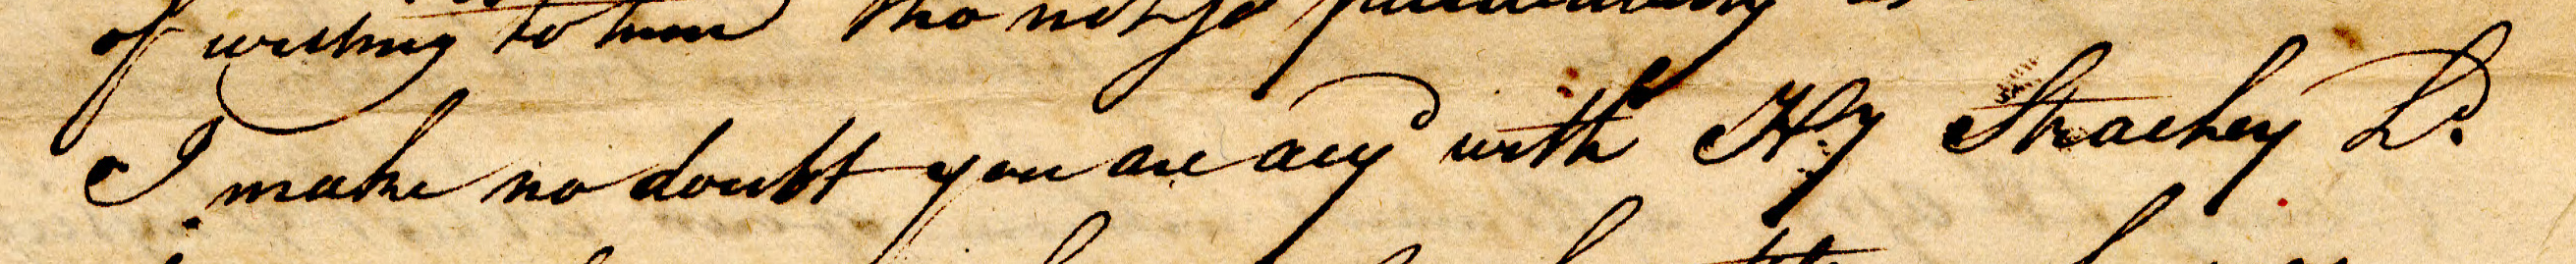I make no doubt you are ocy^d with H^y Strachey L^d.
